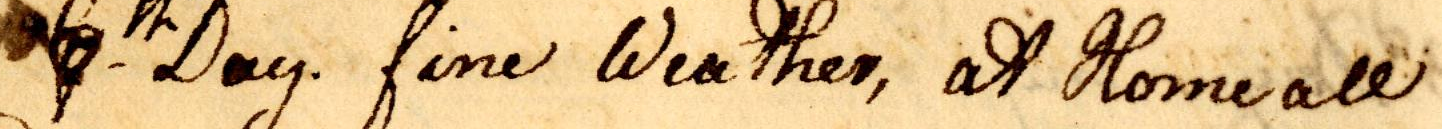6^th Day. fine Weather, at Home all
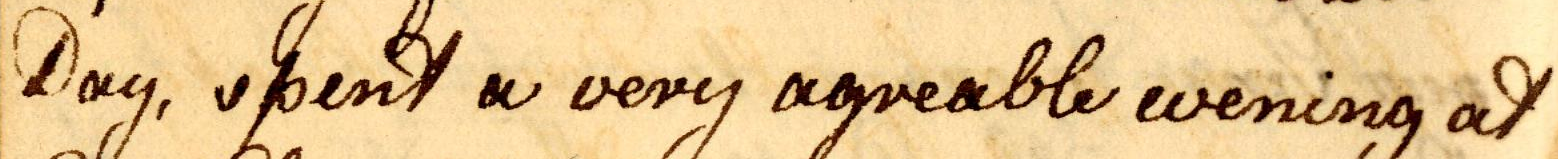Day, spent a very agreable evening at
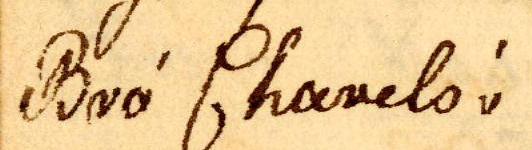Bro' Charels's
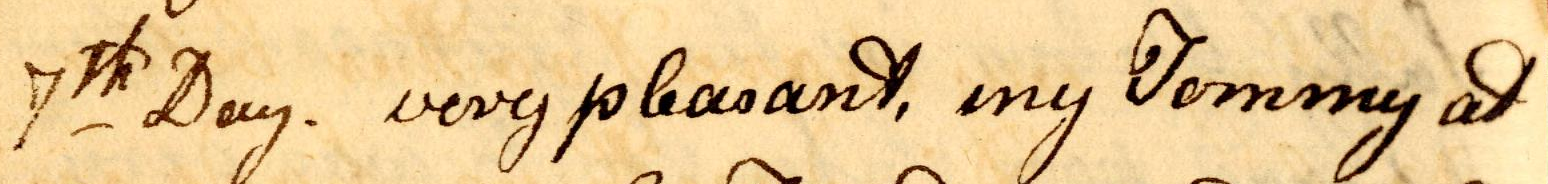7^th Day. very pleasant, my Tommy at
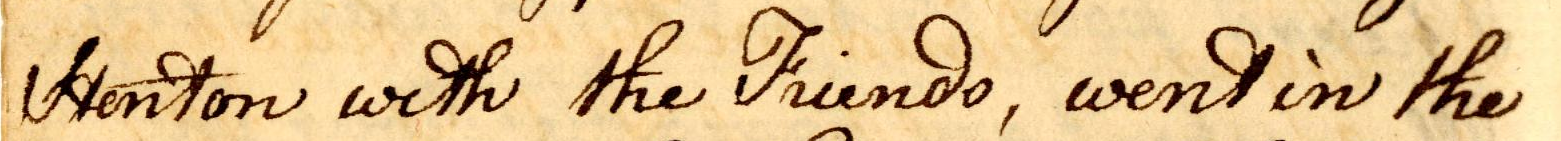Stenton with the Friends, went in the
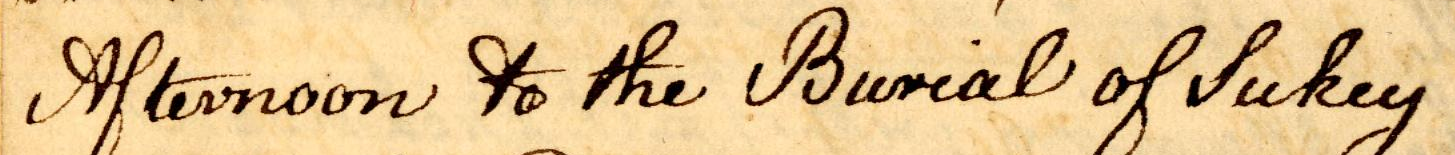Afternoon to the Burial of Sukey
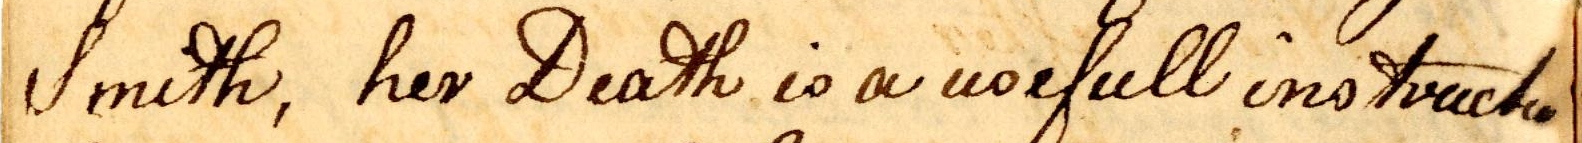Smith, her Death is a usefull instructi
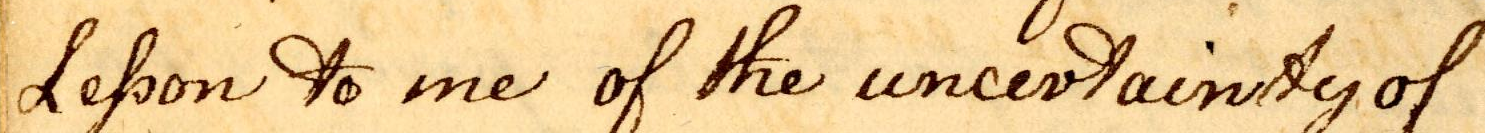Lesson to me of the uncertainty of
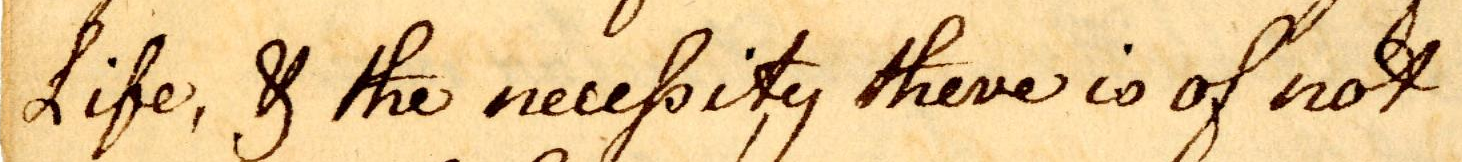Life, & the necessity there is of not
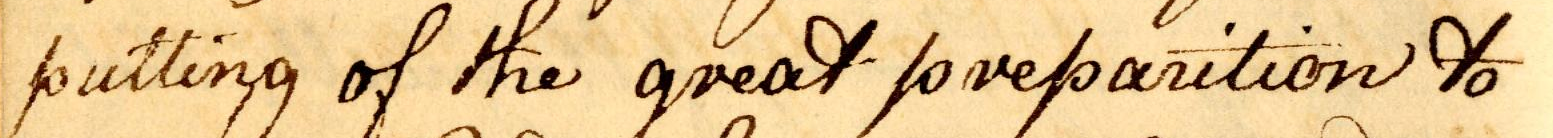putting of the great preparition to
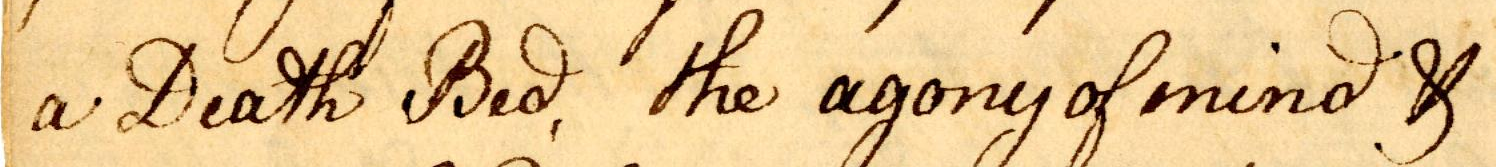a Death Bed, the agony of mind &
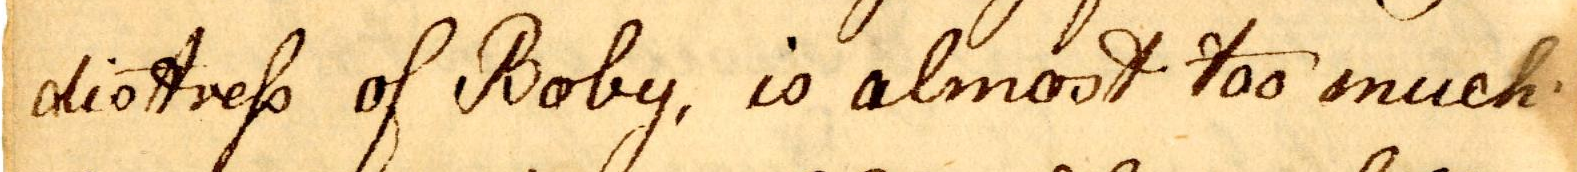distress of Baby, is almost too much
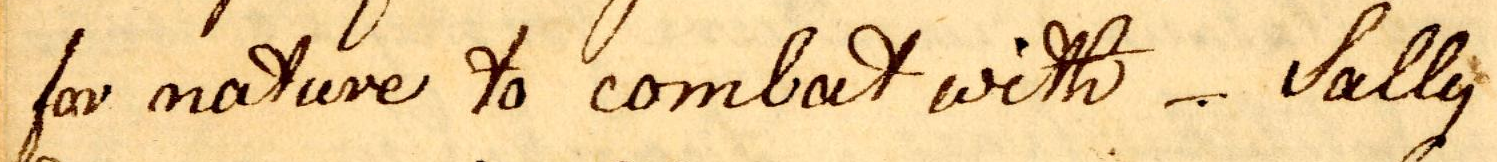for nature to combat with- Sally
